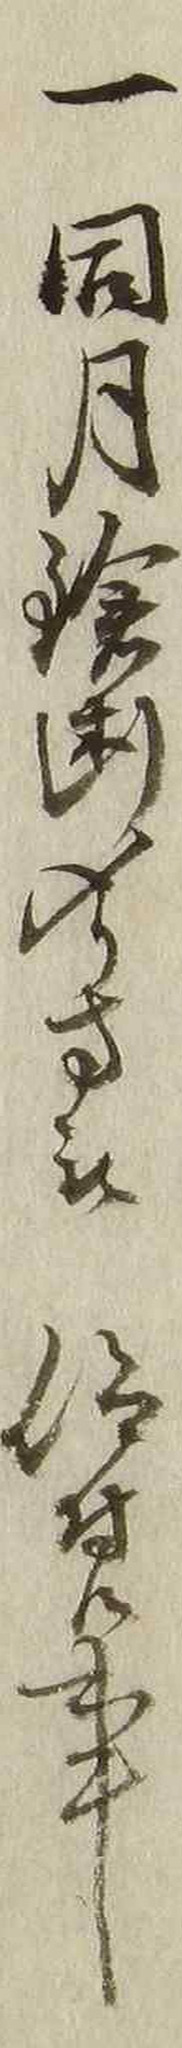一同月鎗術〆り方被仰付候事
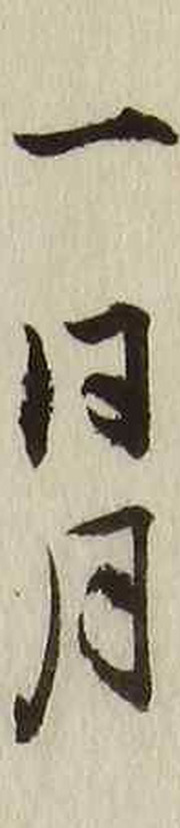一同月
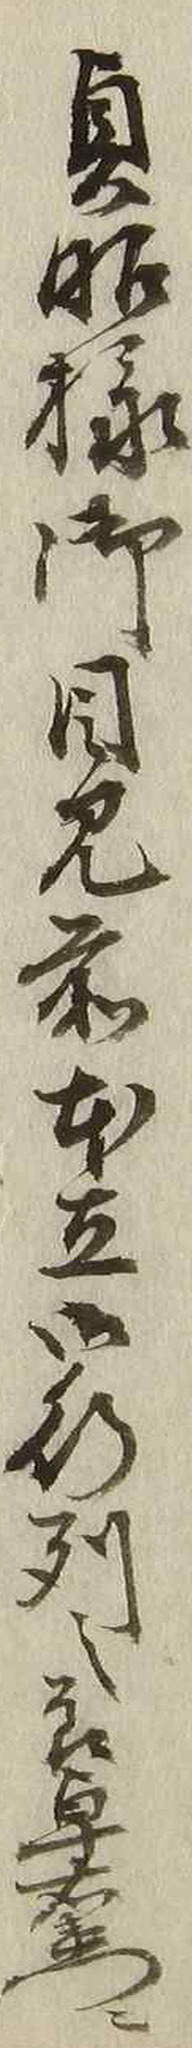貞昭様御目見前本立御行列之節卓右衛門ニ
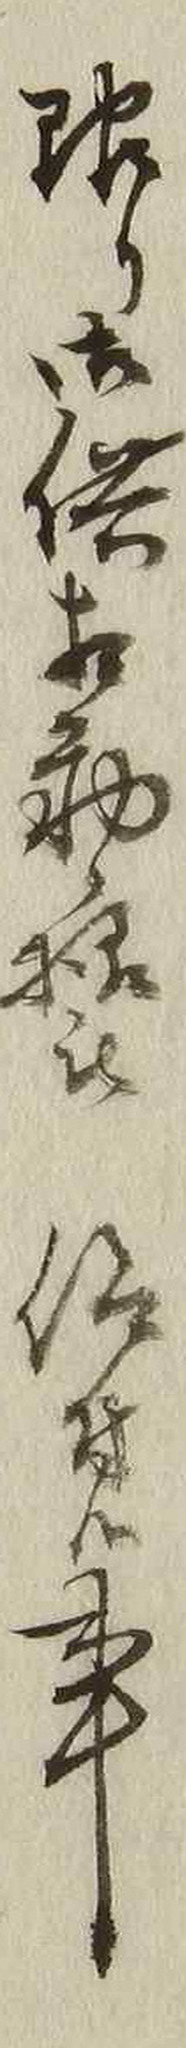限り御供相勤候様被仰付候事
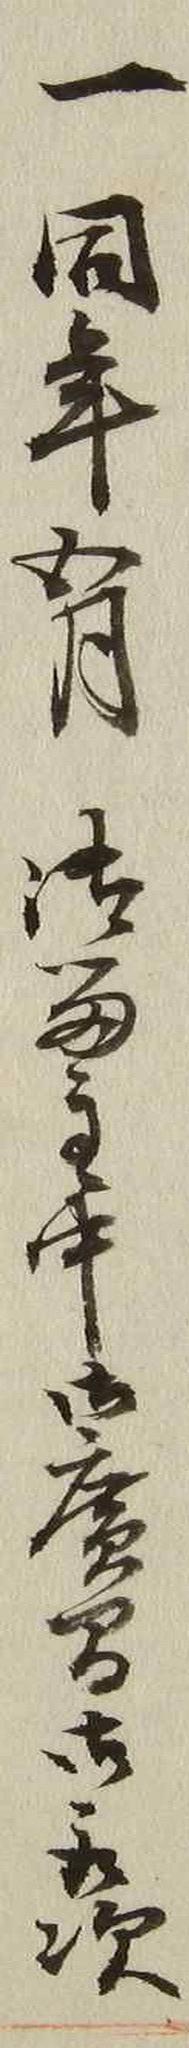一同年五月御留主中御広間御取次
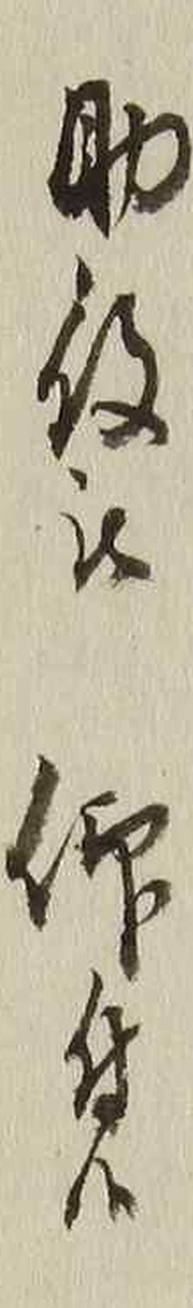助役被仰付候
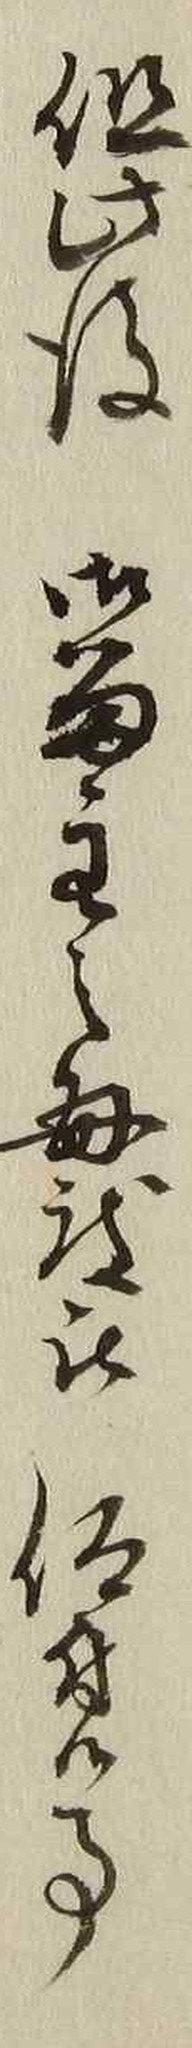但此後御留主之毎度被仰付候事
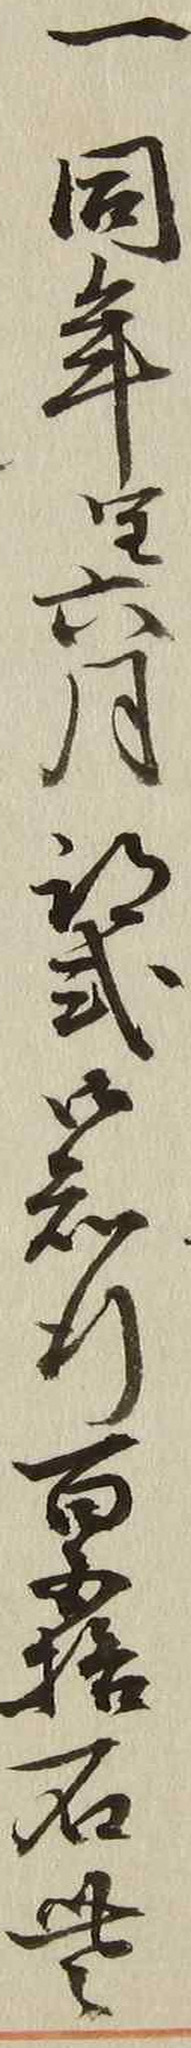一同年閏六月跡弐御知行百五拾石無
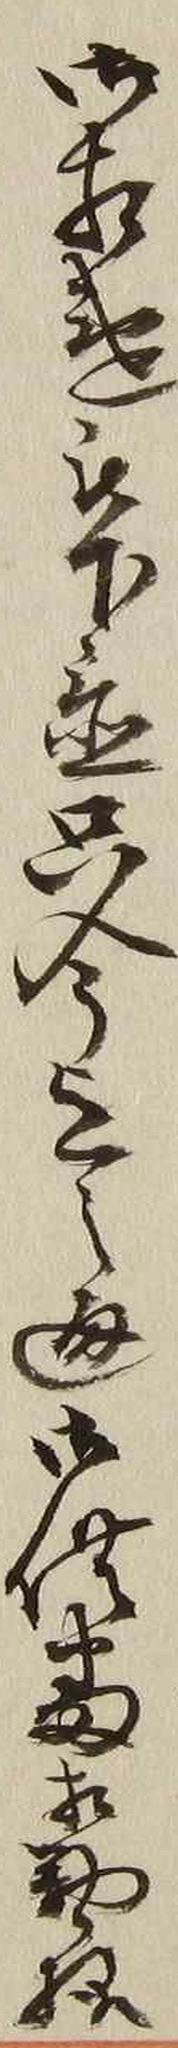御相違被下置只今迄之通御供番相勤候様
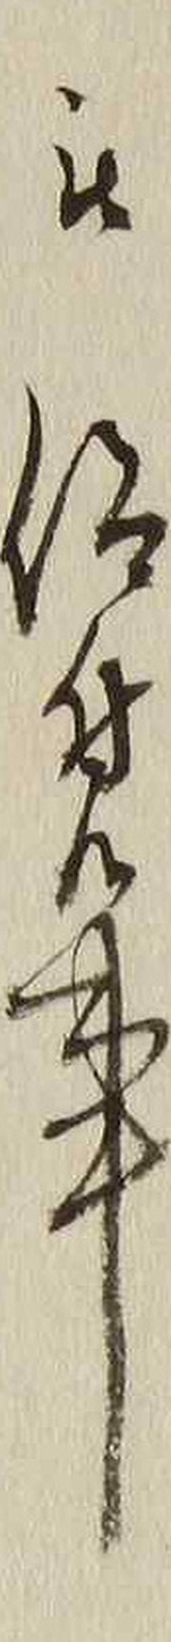被仰付候事
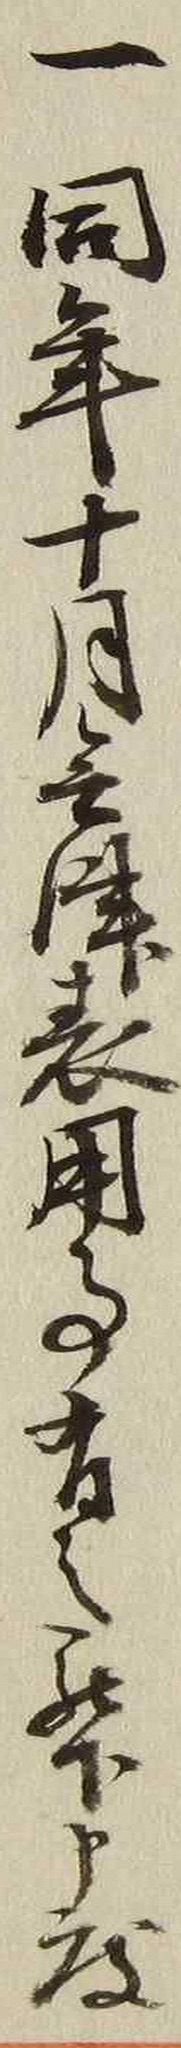一同年十月会津表用事有之罷下申度
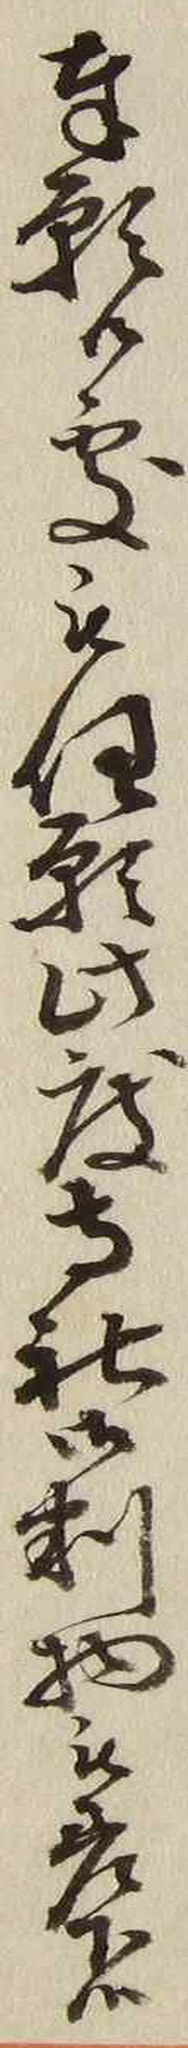奉願候処被任願此度寺社御判物被差下候
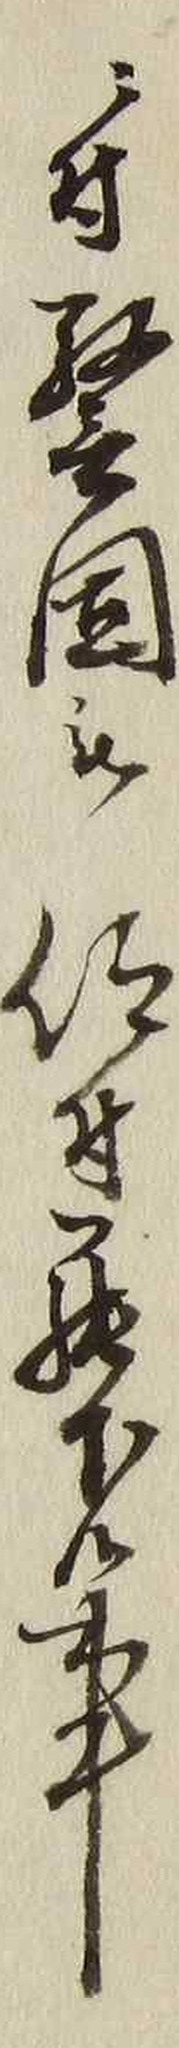ニ付譬固被仰付罷下候事
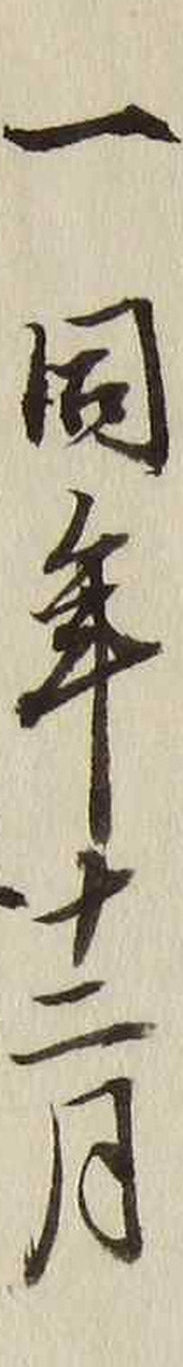一同年十二月
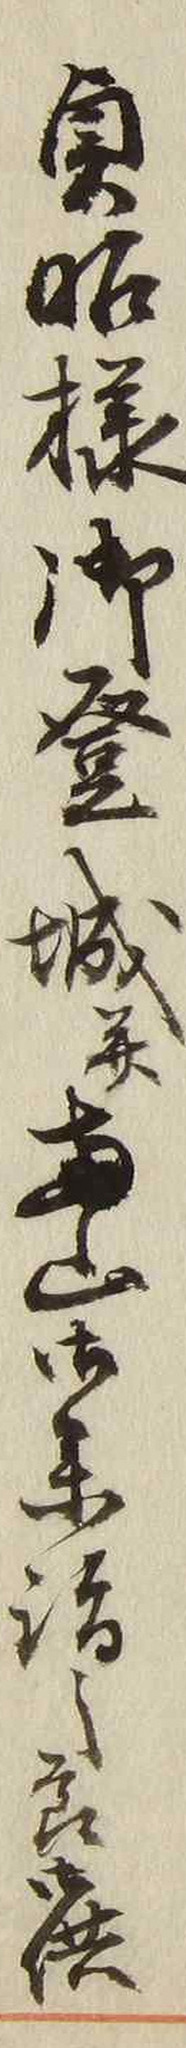貞昭様御登城并両山御参詣之節御供
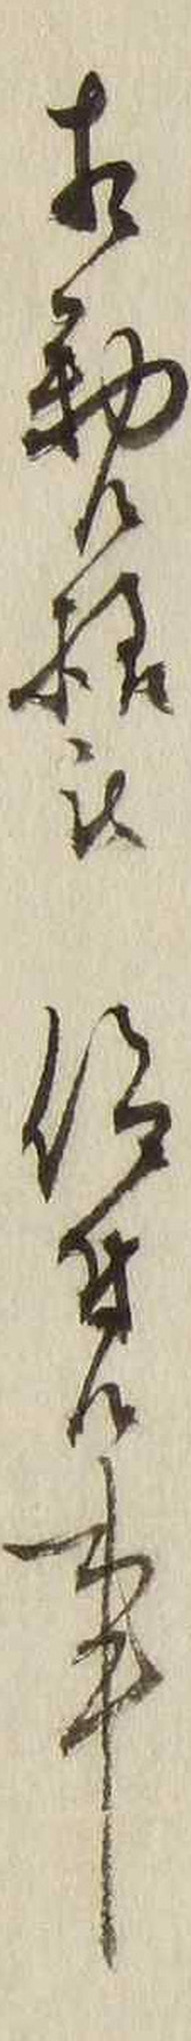相勤候様被仰付候事
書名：諸士系譜　巻之23　い之部23
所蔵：会津若松市立会津図書館
